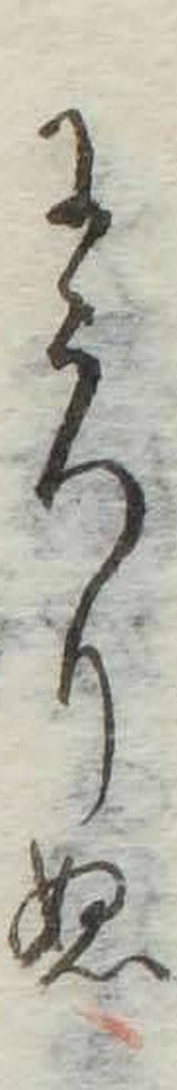にうつりぬ
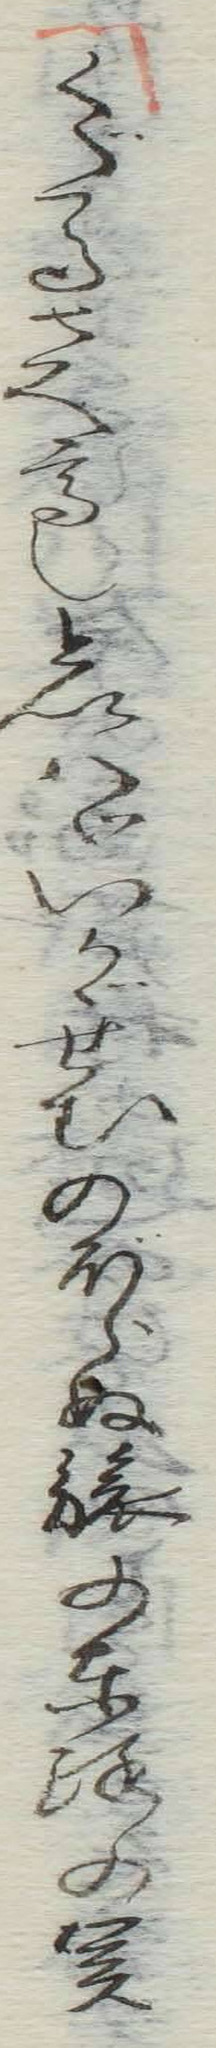〽くだるさへ高しといはゞいかゞせむのぼらぬ旅の東路の関
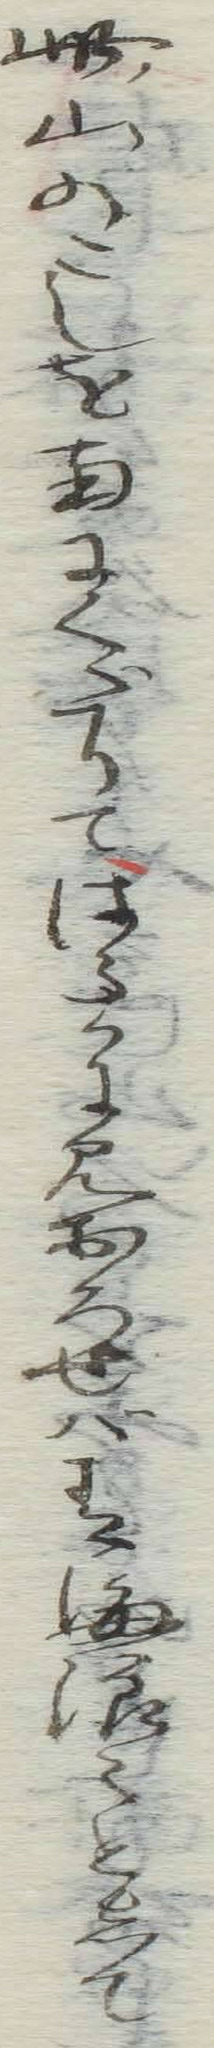此山のこしを南にくだりて、はるかに見おろせば青海浪々として
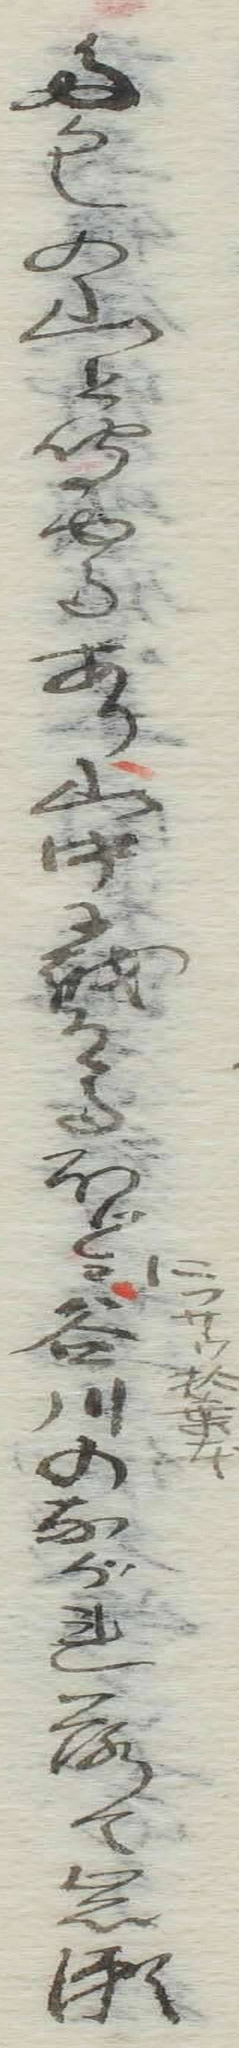たかしの山と聞ゆるあり、山中に越かゝるほどニ、谷川のながれ落て岩瀬
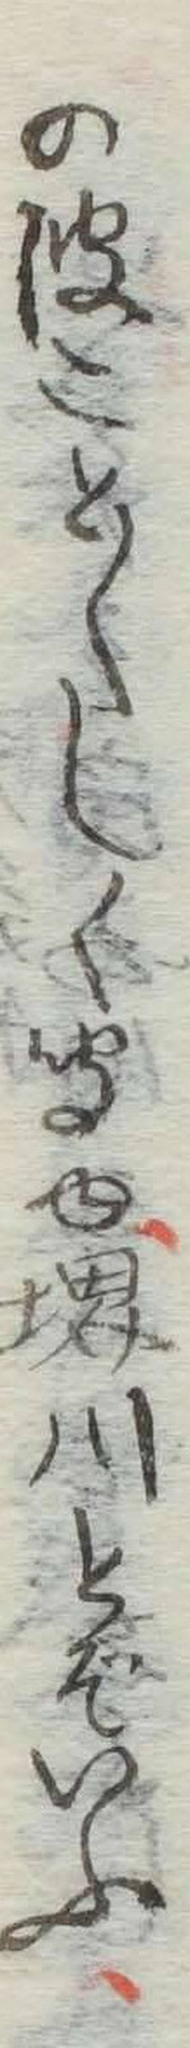の波こと〳〵しく聞ゆ、堺川とぞいふ、
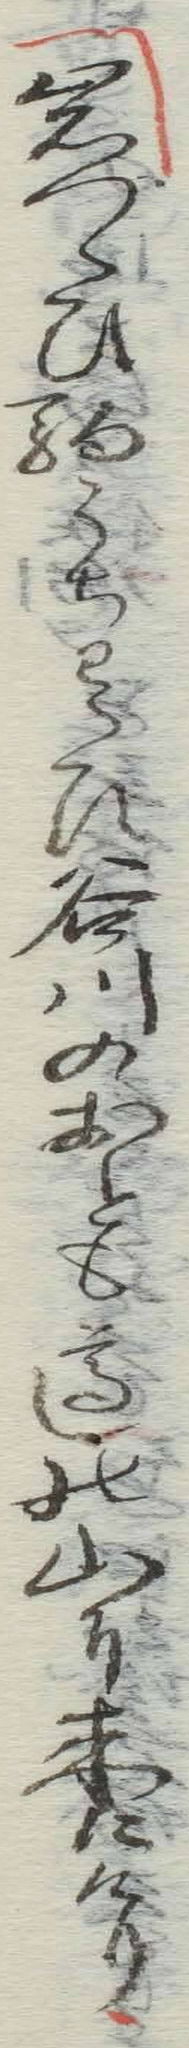〽岩づたひ駒うちわたす谷川のおとも高しの山二来にけり、
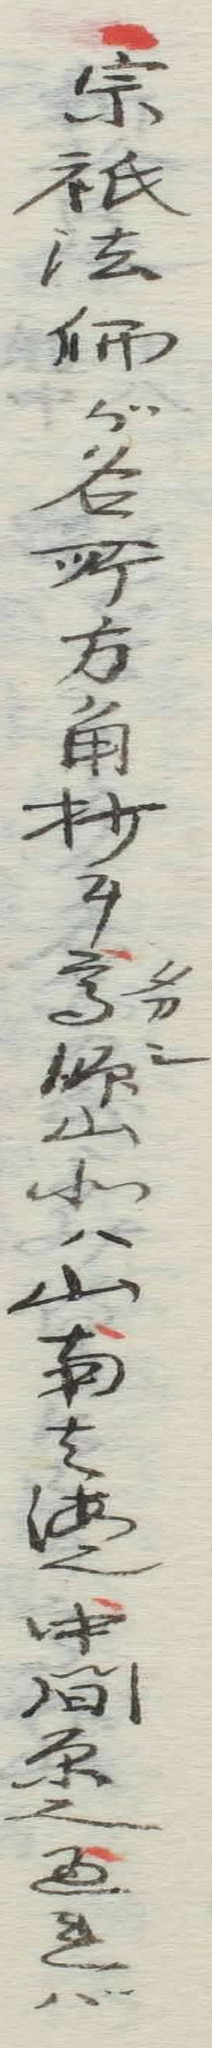●宗祇法師が名所方角抄に高師山北は山、南は海也、中間原也、過れば
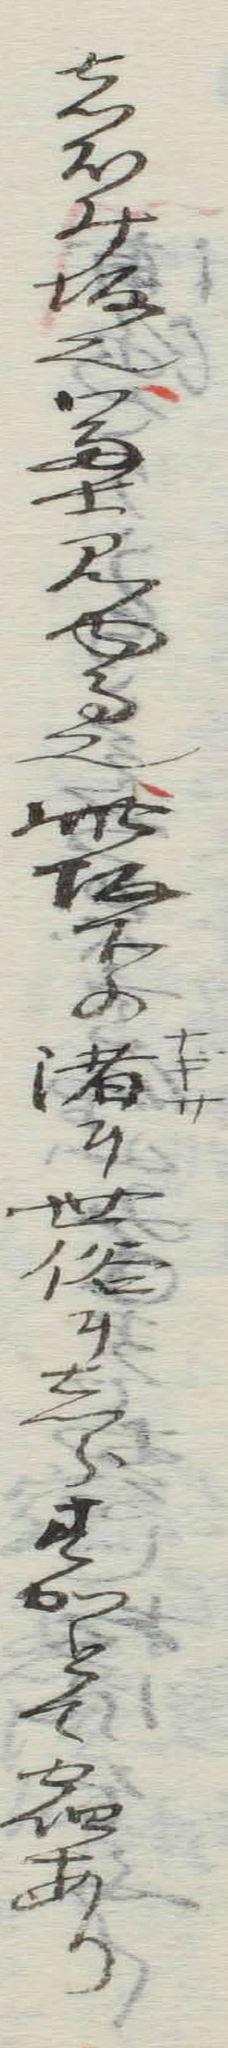しほみ坂也、富士見ゆる也、此坂下の渚に世俗にしらすかとて宿あり、
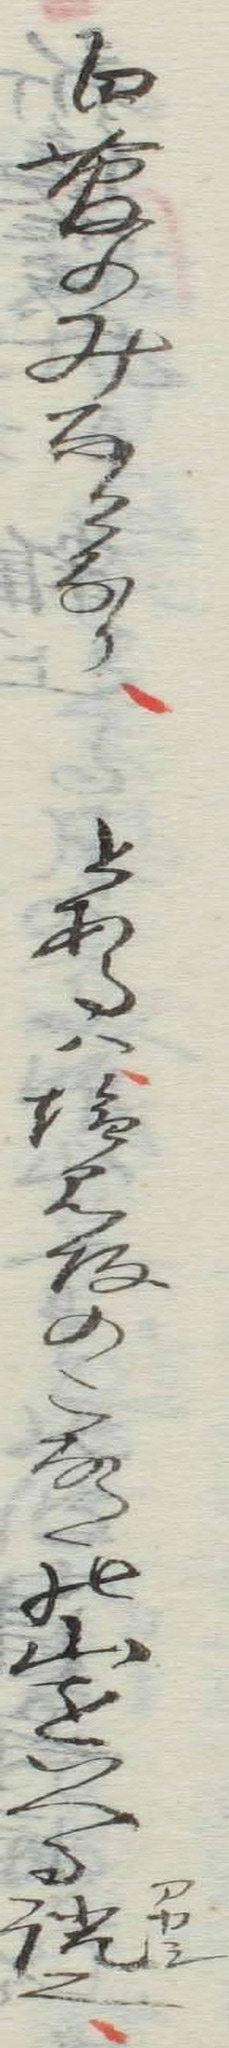白菅のみなとなり、とあるは、塩見坂のこなたの山をいへる証也、
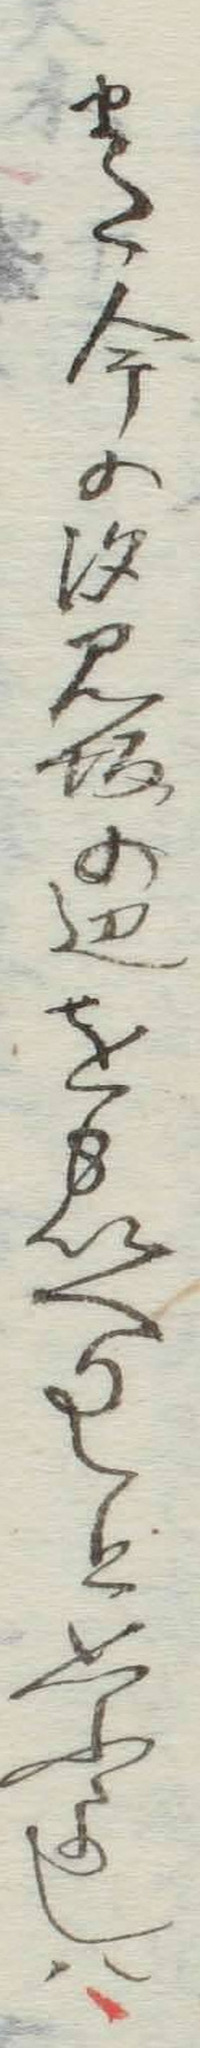また今の汐見坂の辺をもいへりしと思ふよしは、
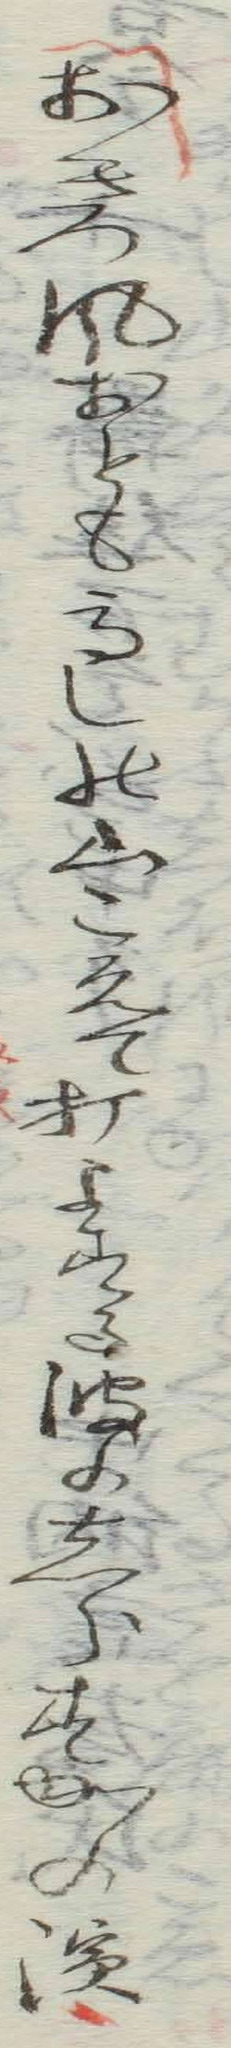〽おきつ風おとも高しの山こえて打よする波のしらすかの濱、
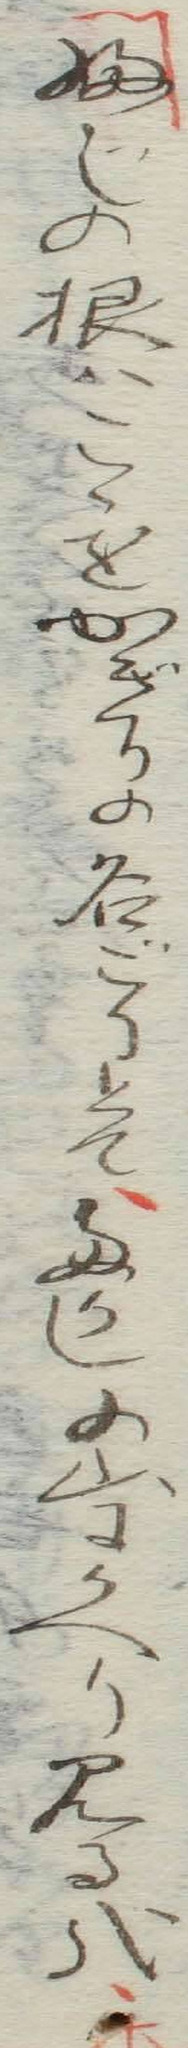〽ふじの根はこゝをかぎりの名ごりとて、たかしの山にかへり見る哉、ホ

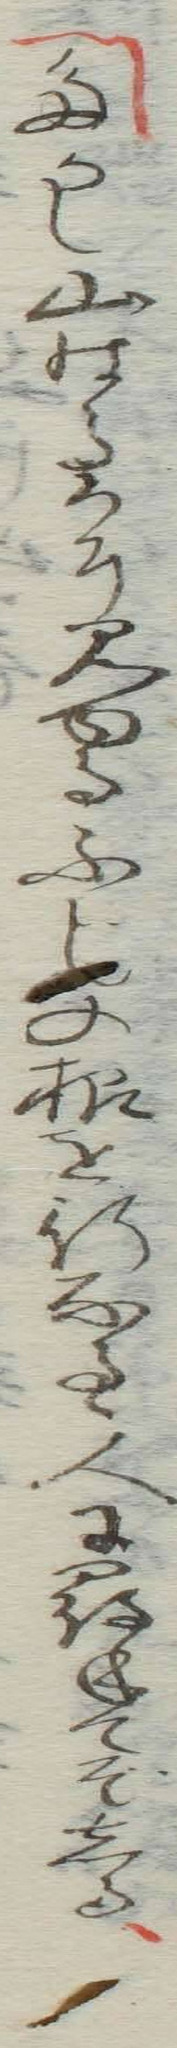〽たかし山はるかに見ゆるふじの根を行なるヽ人に尋ねてぞしる、
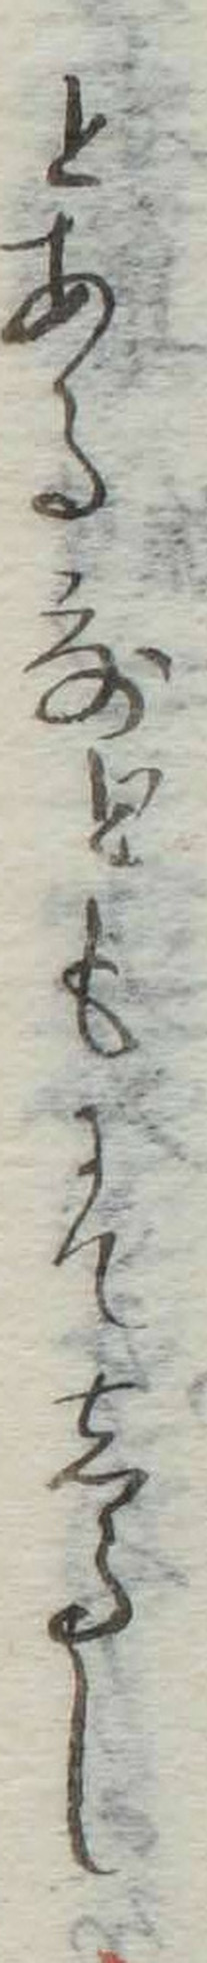とある歌どもにてしるし、
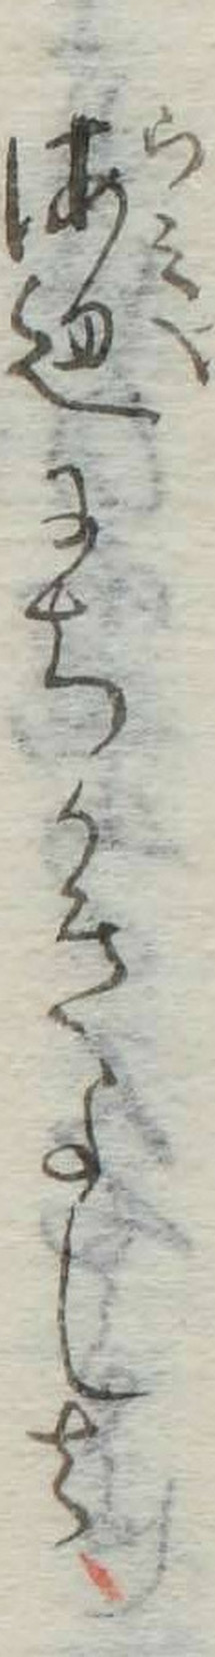海辺にちかきよしは、
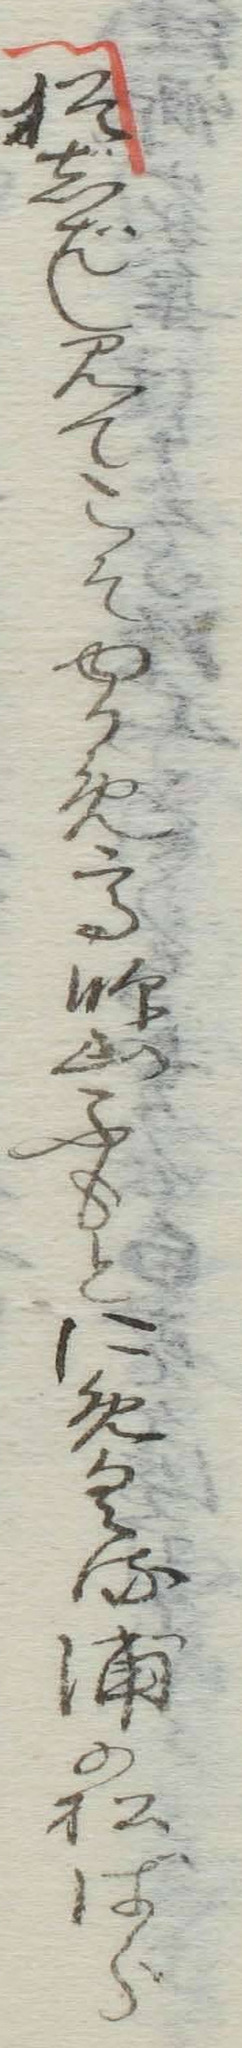〽猶しばし見てこそゆかめ高師山ふもとにめくる浦の松ばら
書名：三河国古跡考
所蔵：国文学研究資料館
